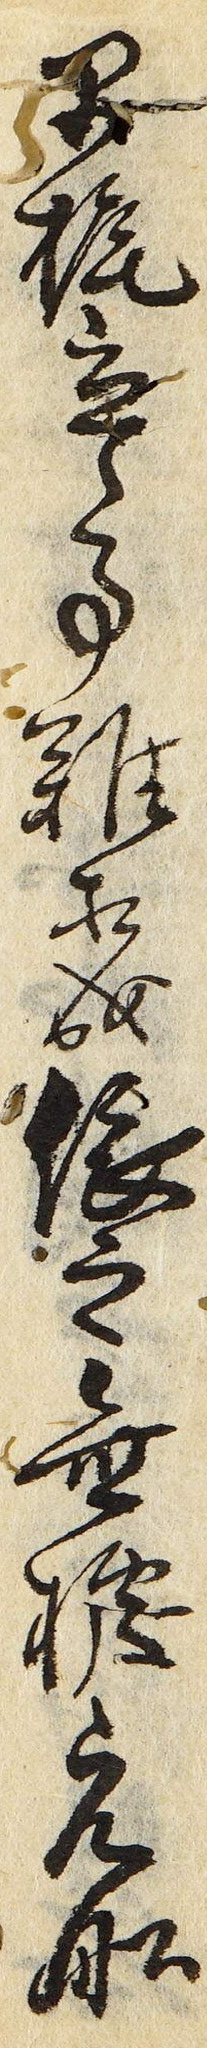早梶立候事難相成依之無拠元船
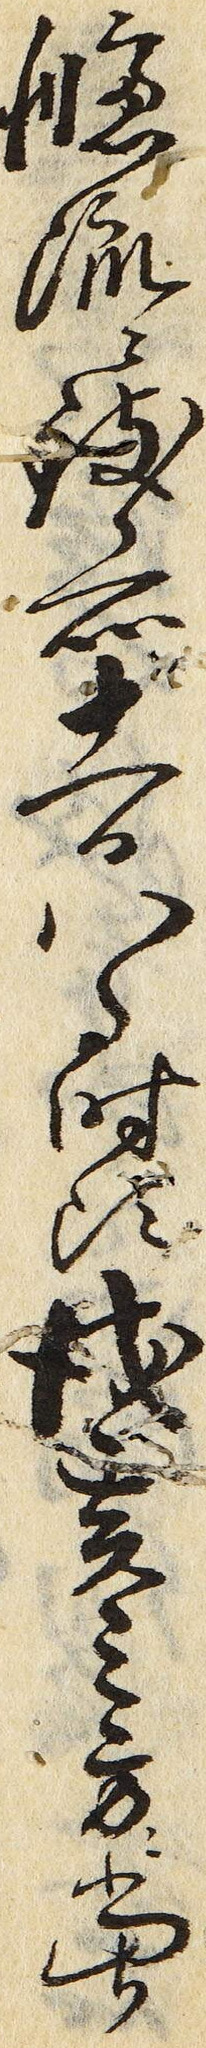艫流ニ致候所十一日八ツ時頃戌亥之方ニ当り
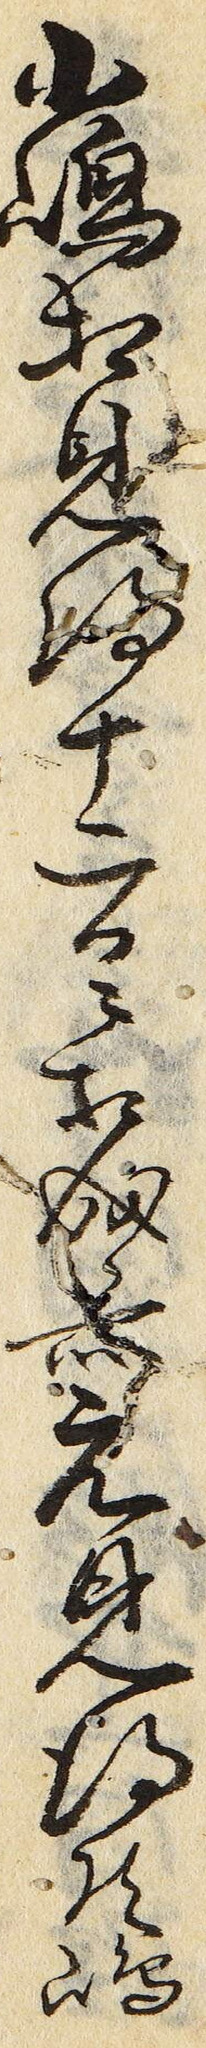小嶋相見得十二日ニ相成候所元見得候島
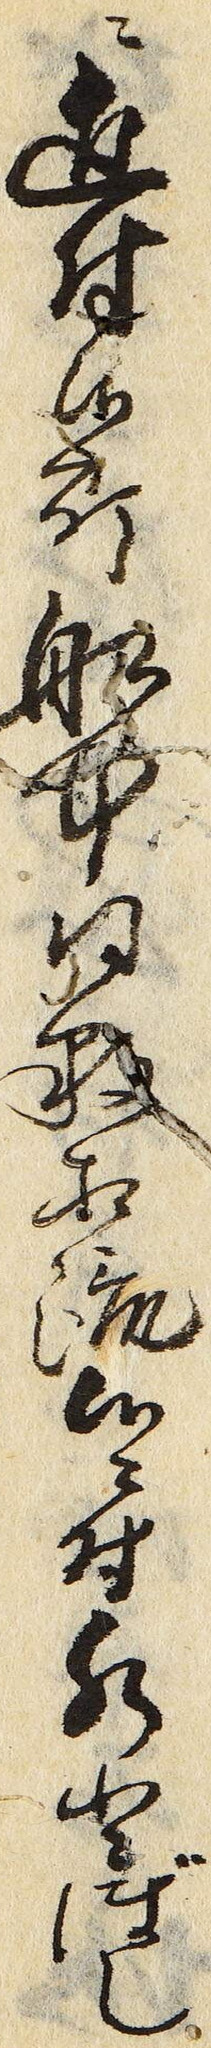ニ近付候所船中日数相流候ニ付水とぼし
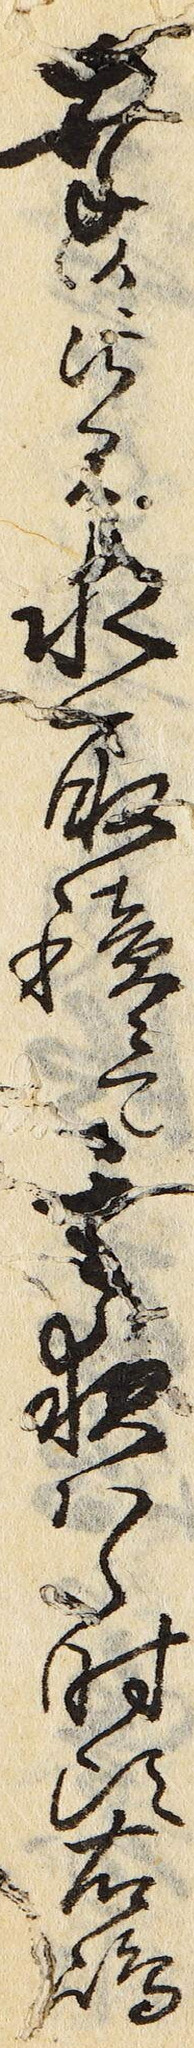幸イニ候間水取積ニて其夜八ツ時頃右嶋
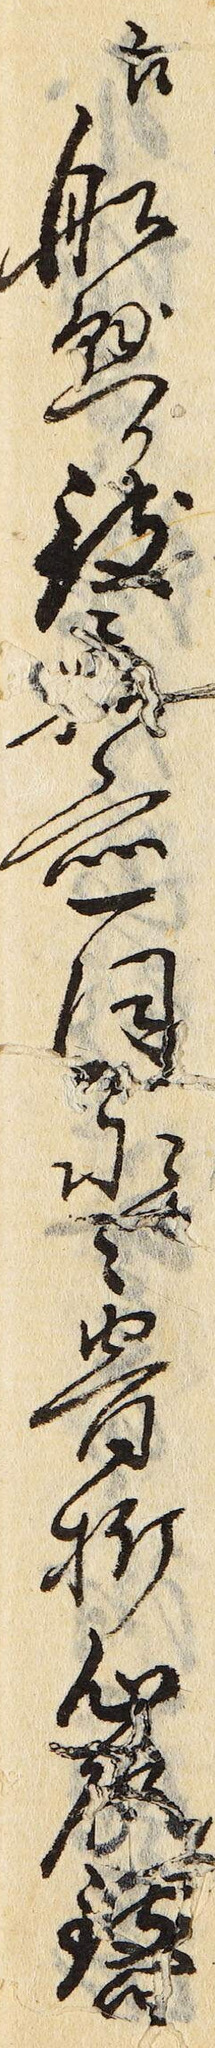江船懸り致候所一同永々骨折心致候
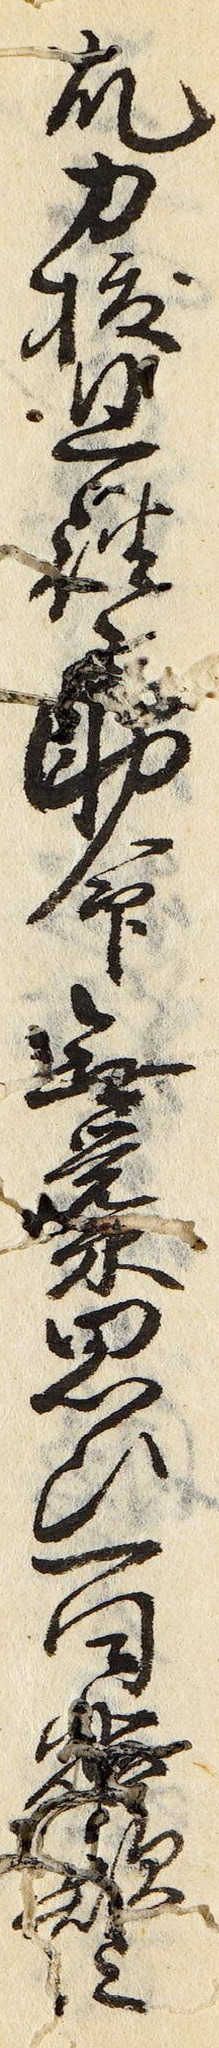故力抜且往々助命無覚束思ひ一同悲歎之
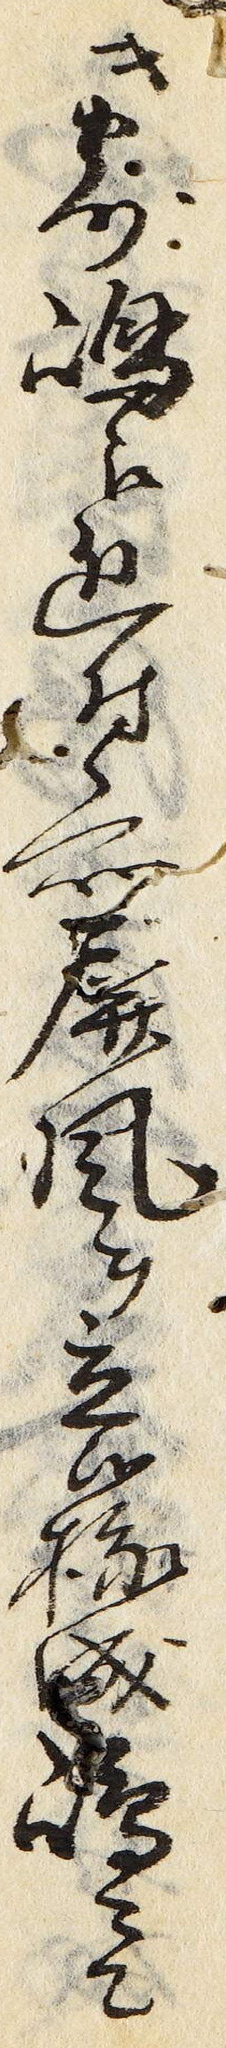キ寄嶋江近付候所屏風ヲ立候様成島ニて
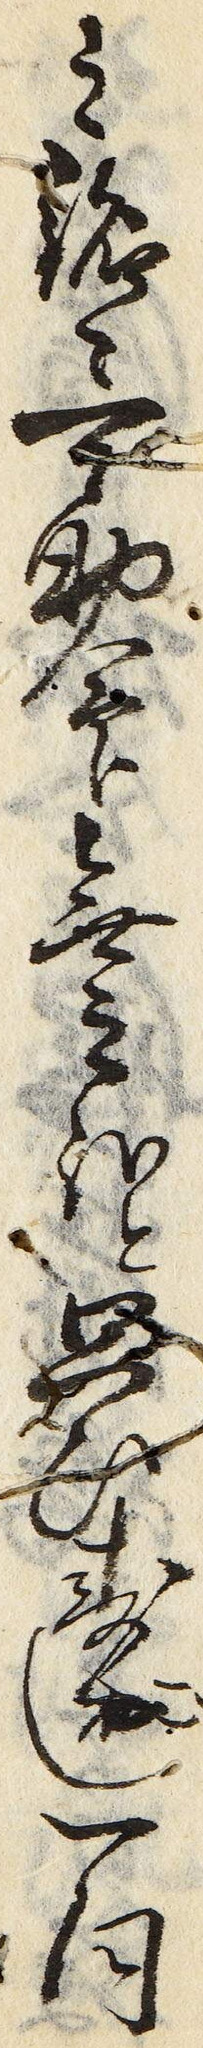之銘々可助命無之哉と思ひすごし一同
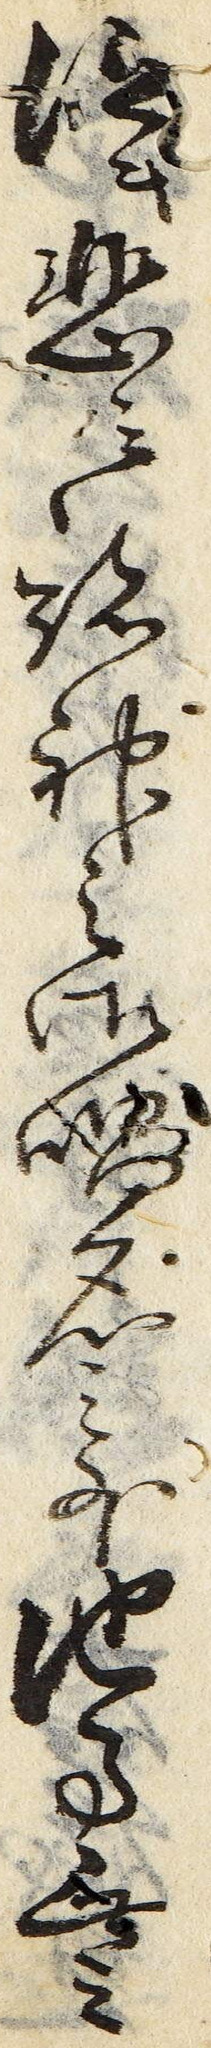泣キ悲ミ弥神之御唱名之外他事無之
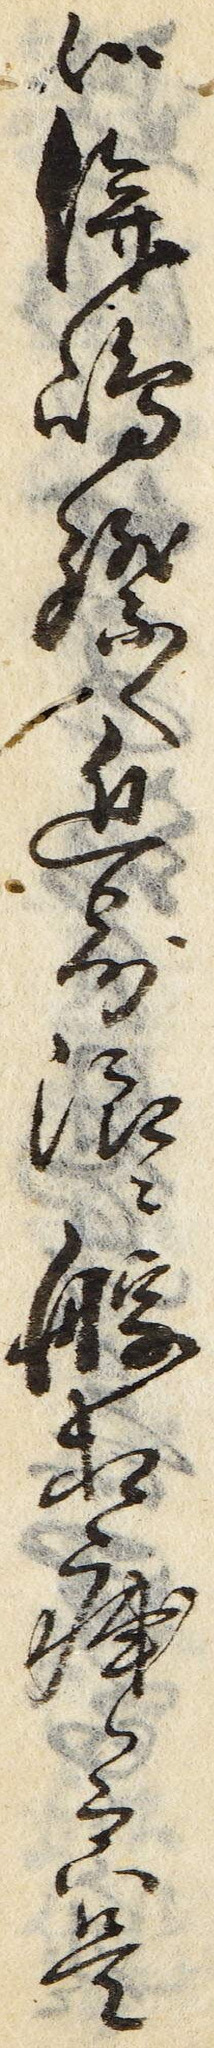乍併嶋際へ近寄浪ニ艀相痛候而ハ是
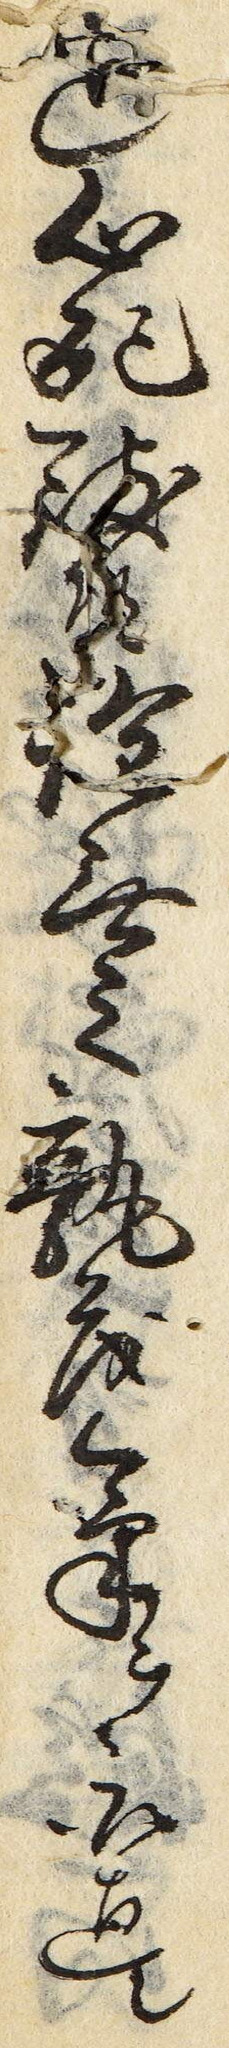迄心配致候詮無之孰も気ヲ取直シ

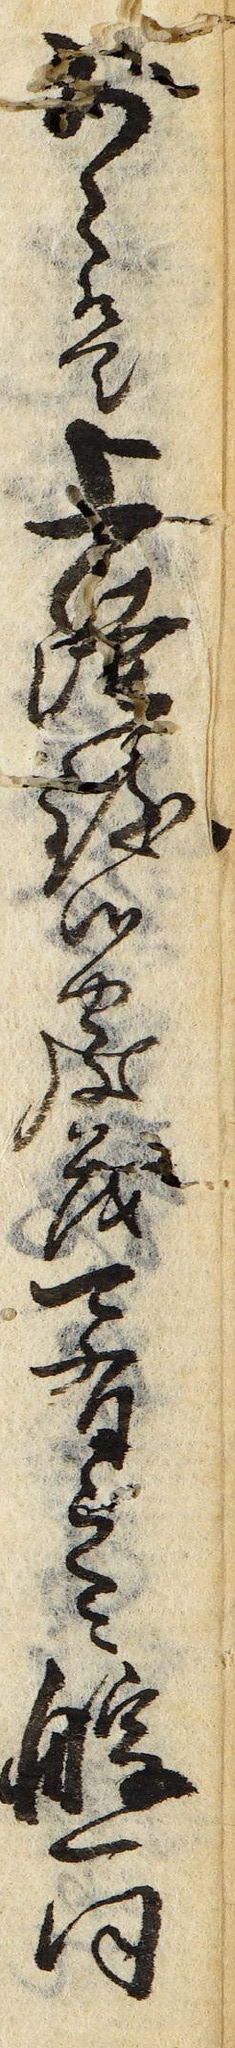前々は上陸致候処も可有之与艀一同
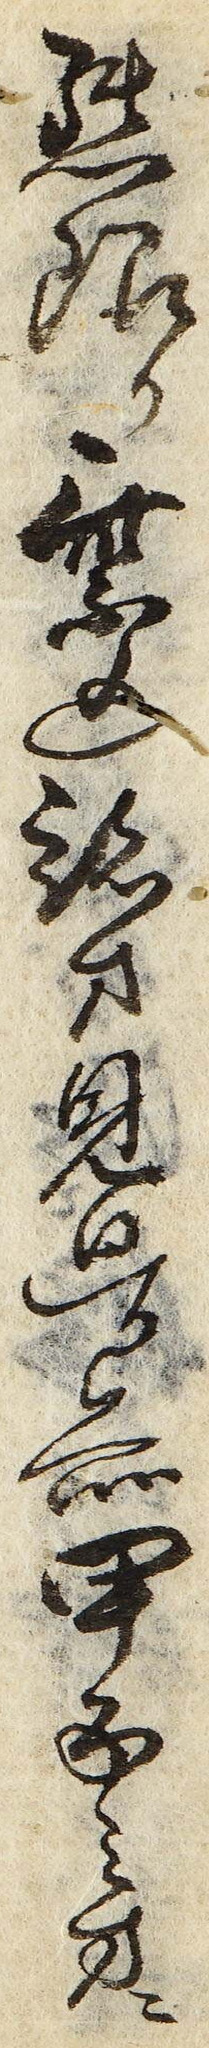態限り乗込諸方見廻り候所甲子之方ニ
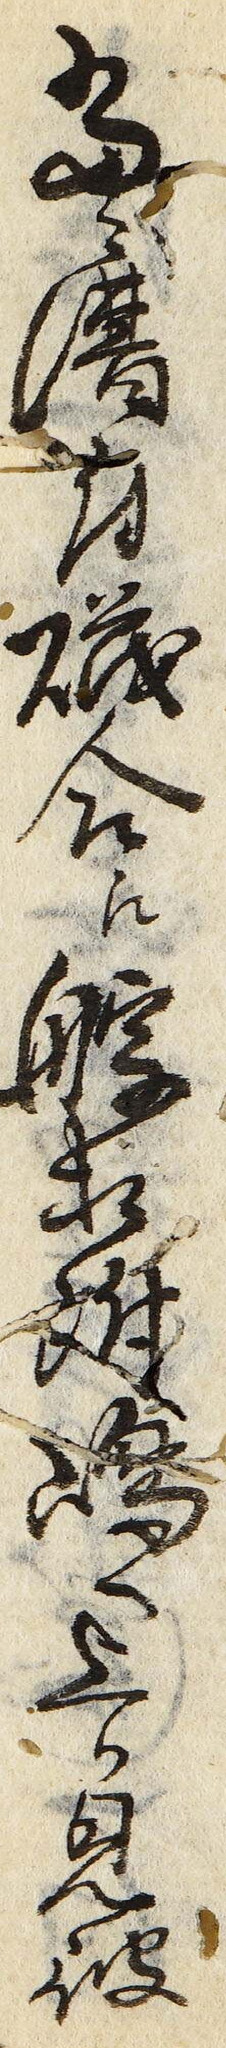当ニ漕付磯合江艀相付嶋へ上り見彼
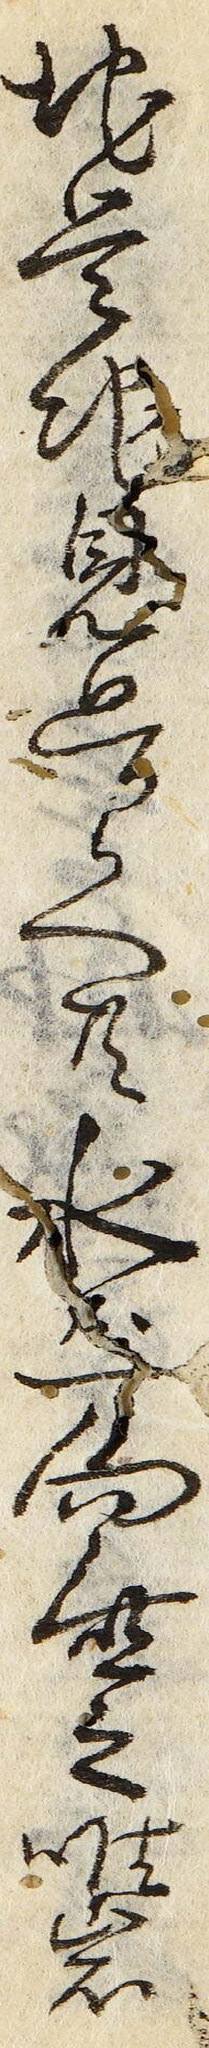地是地見廻り候へ共水一向無之唯岩
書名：阿波幸宝丸漂流記
